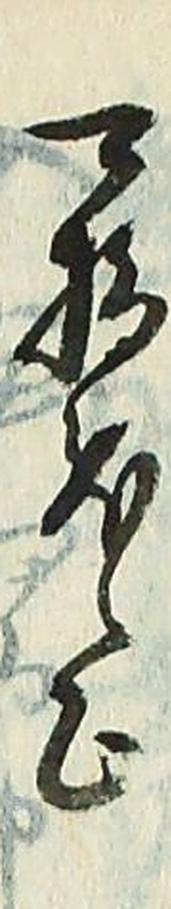可指戻候以上
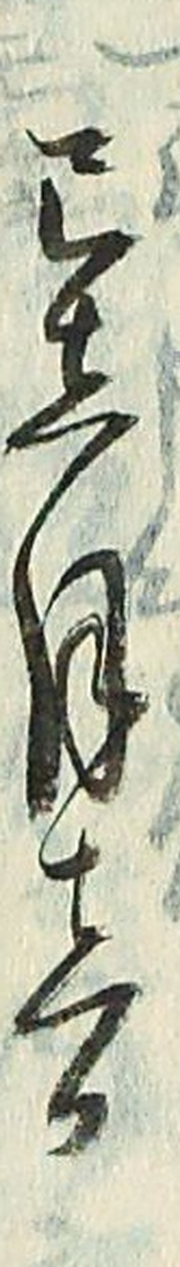巳十二月十二日
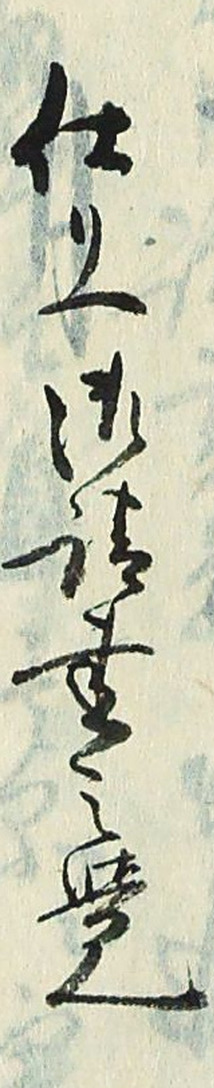仕上御請書之覚
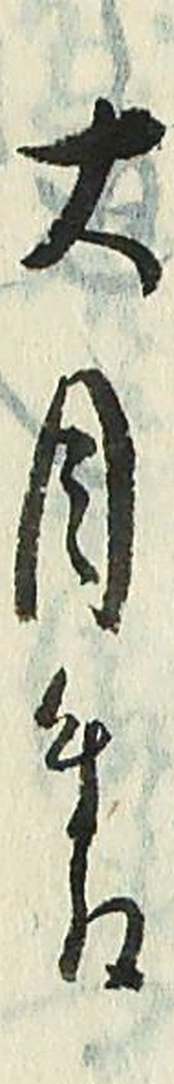大目付江
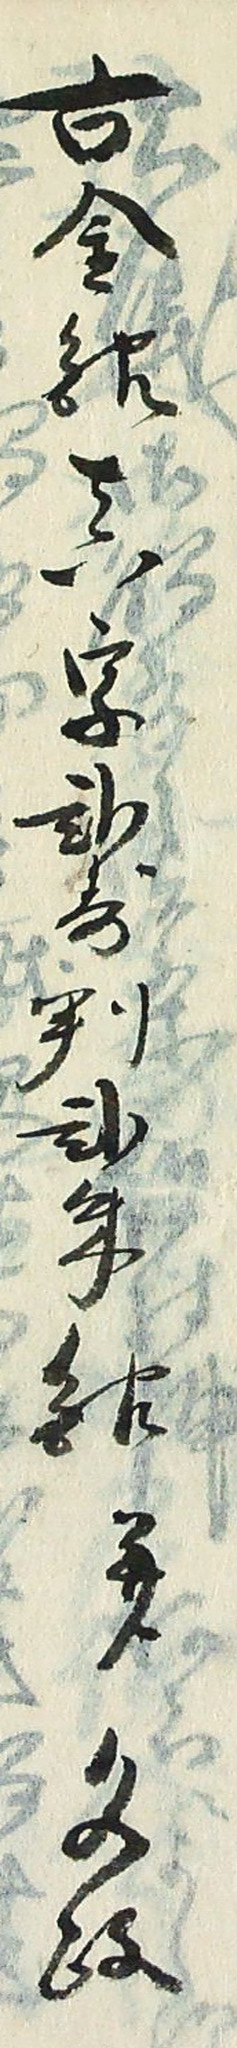古金銀真字弐歩判弐朱銀幷文政
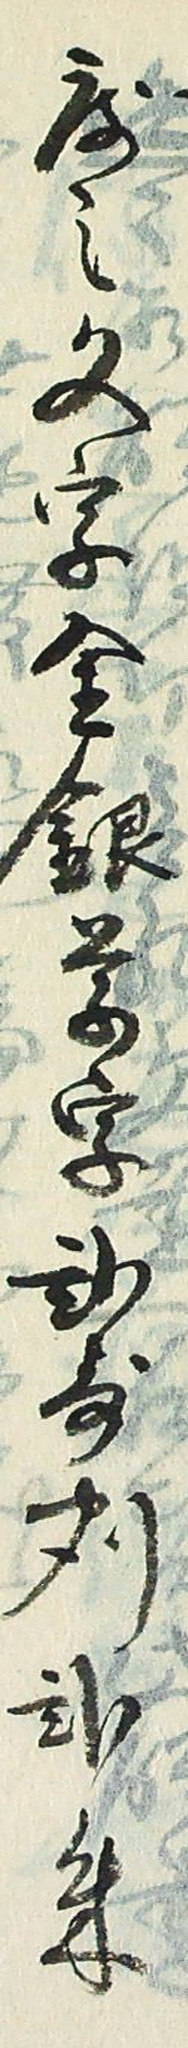度之文字金銀草字弐歩判弐朱
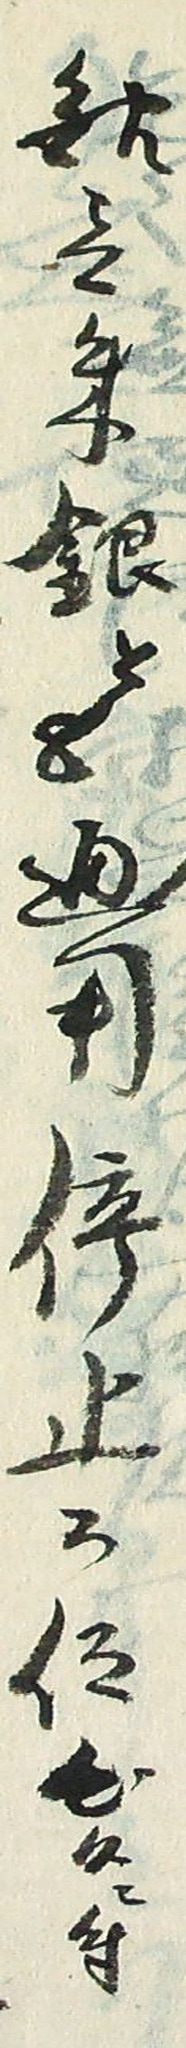銀壱朱銀とも通用停止被仰出候に付
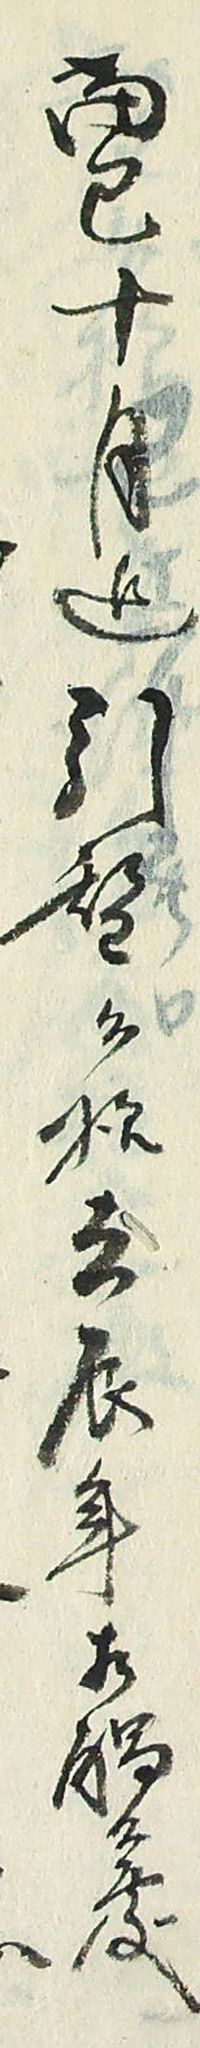当巳十月迄引替候様去辰年相触候処
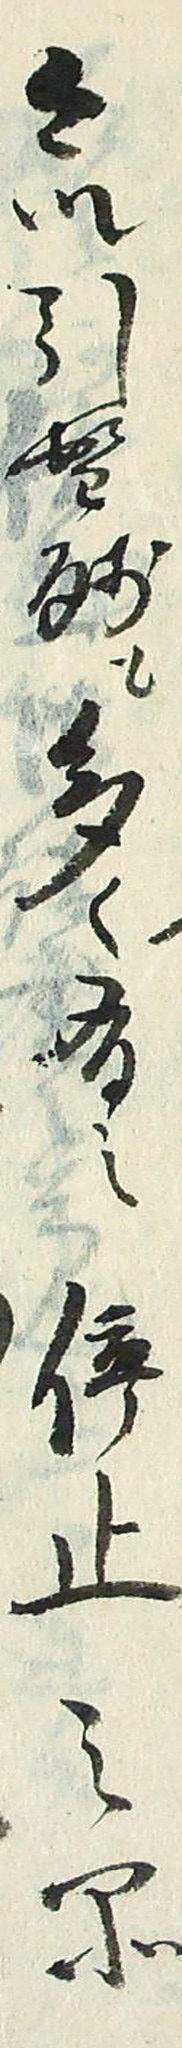今以引替残も多く有之停止之品
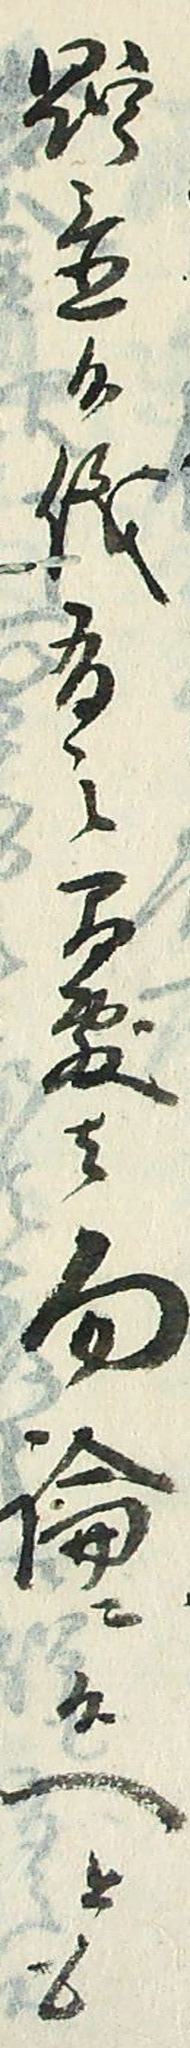貯置候儀有之間敷は勿論に候へとも
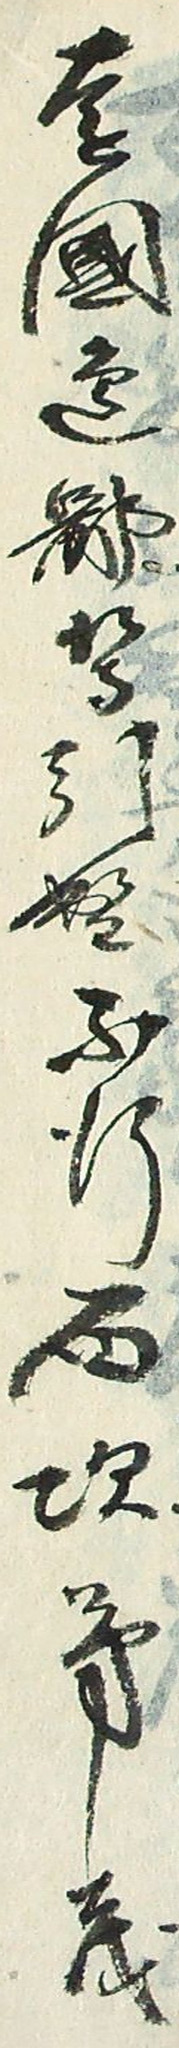遠国辺鄙等引替不行届次第も

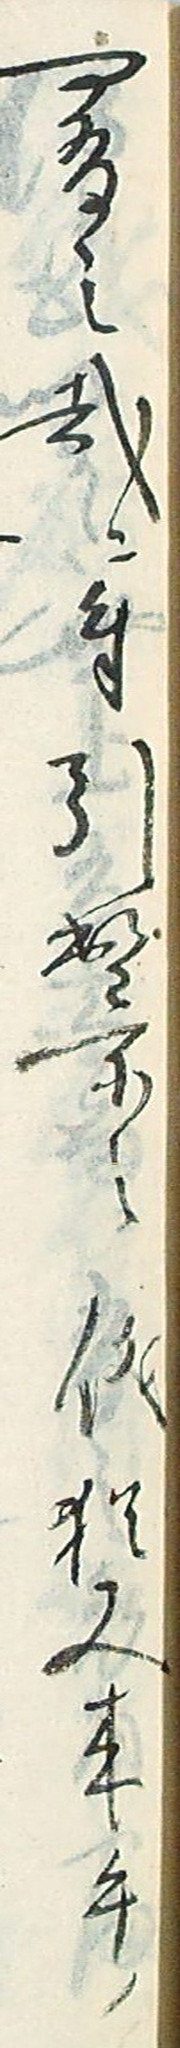可有之哉に付引替所之儀猶又来午の
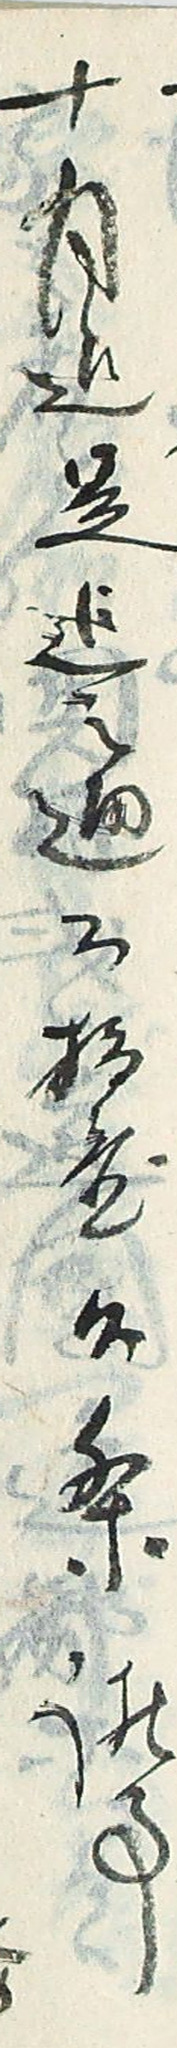十月迄是迄之通被指置候状諸事
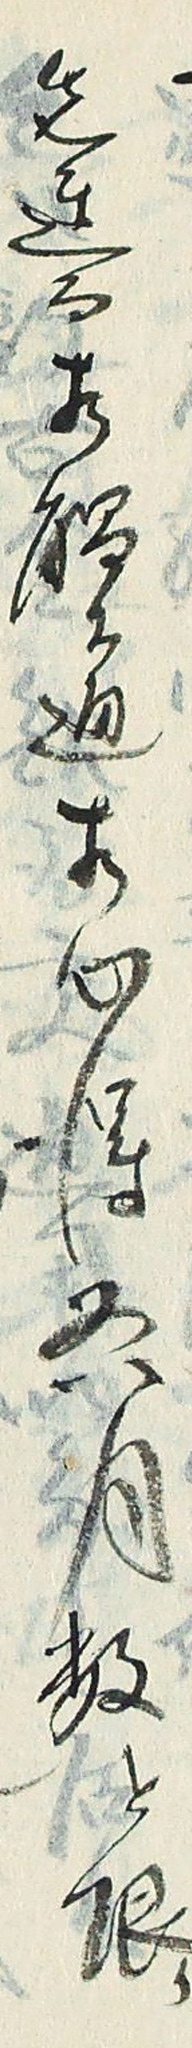先達而相触候通相心得右月数を限り
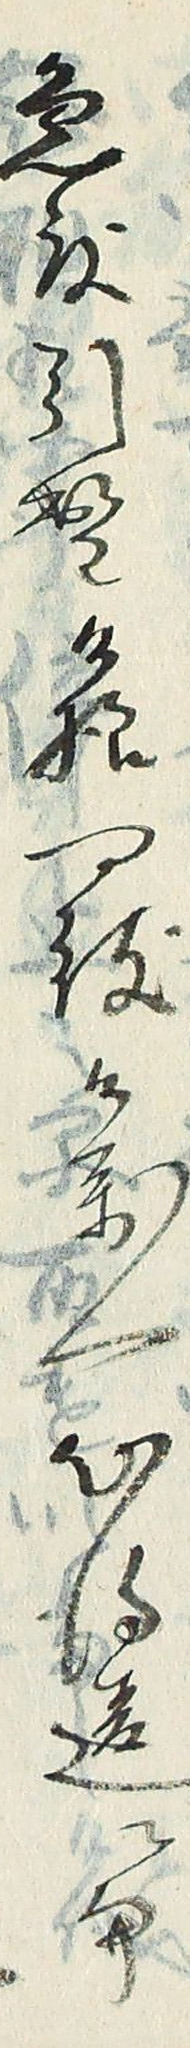急度引替候様可致候万一心得違にて
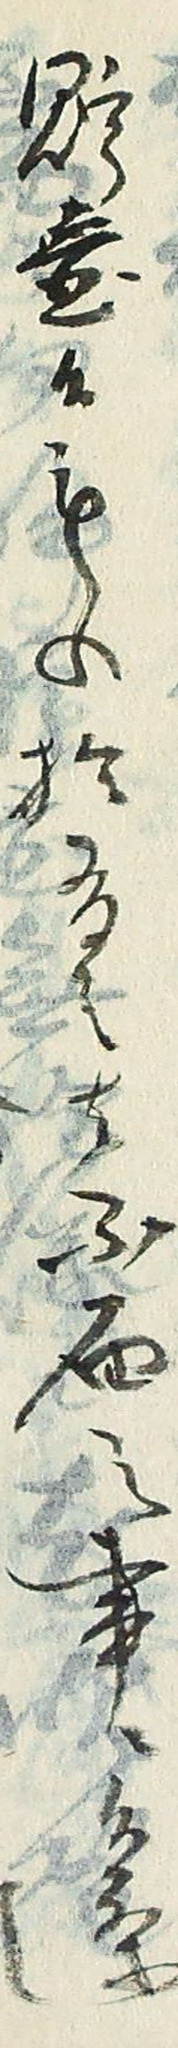貯置候もの於有之は不届之事に候条
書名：諸御用御□受書控
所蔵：鳴門教育大学 Naruto University of Education
